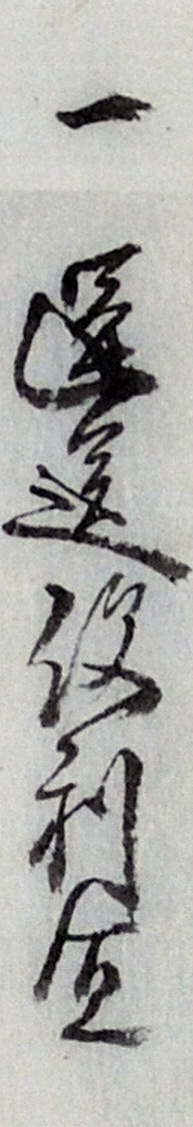一運送便利宜
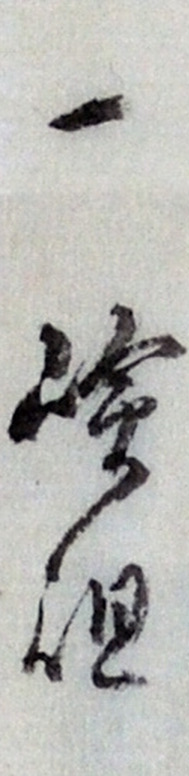一嶮岨
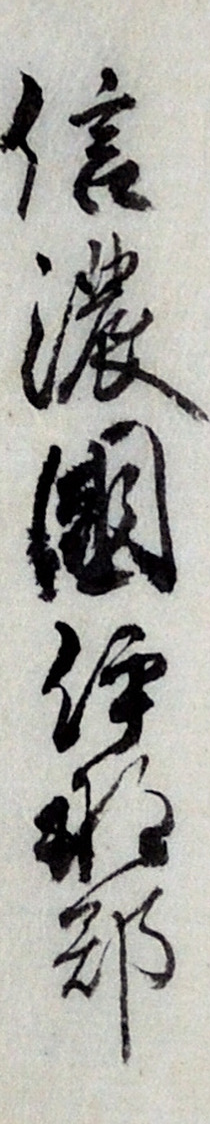信濃国伊那郡
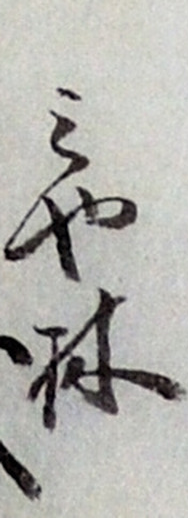みや林
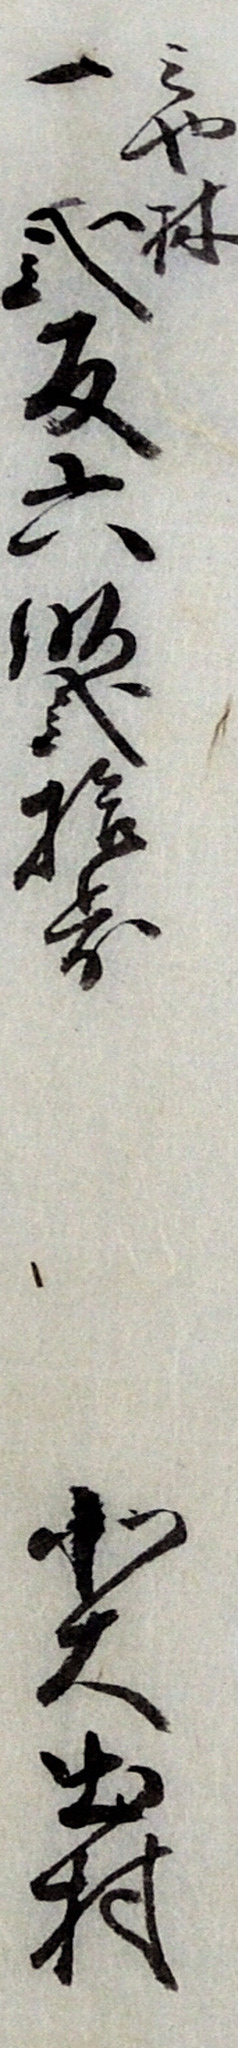一弐反六㽗弐拾歩北大出村
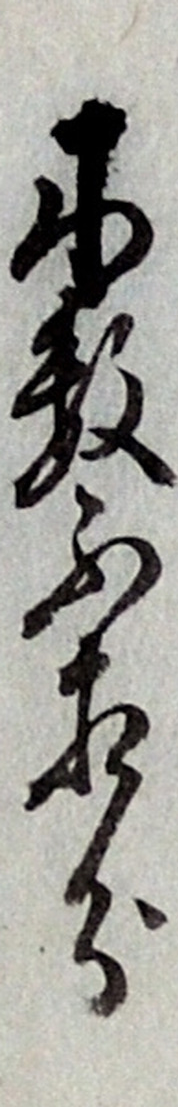木数不相分
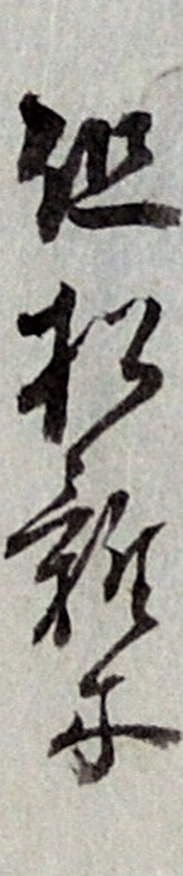但松雑木
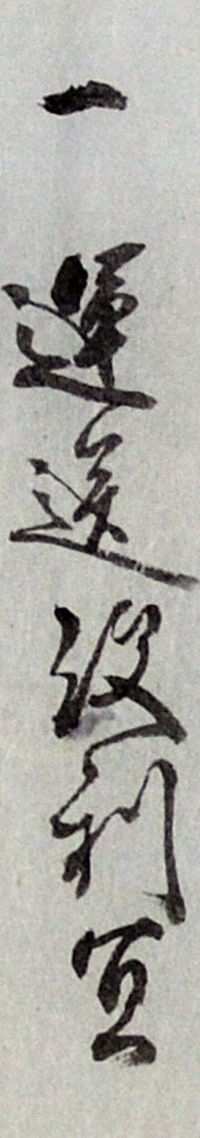一運送便利宜
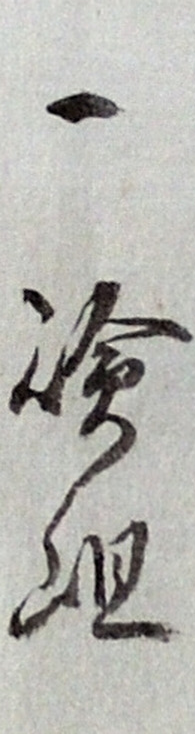一嶮岨

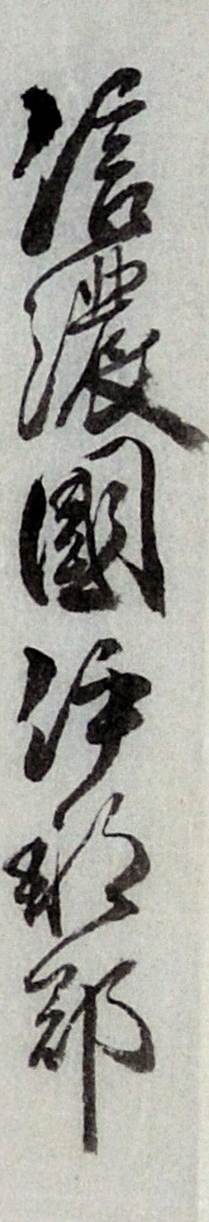信濃国伊那郡
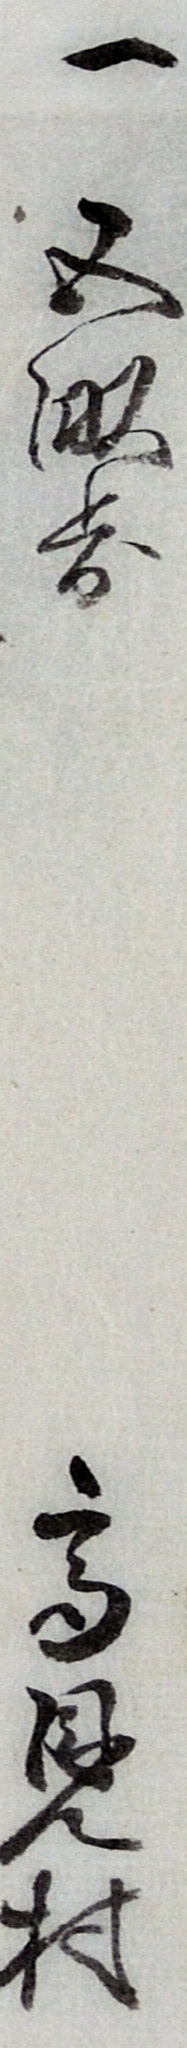一五㽗歩高見村
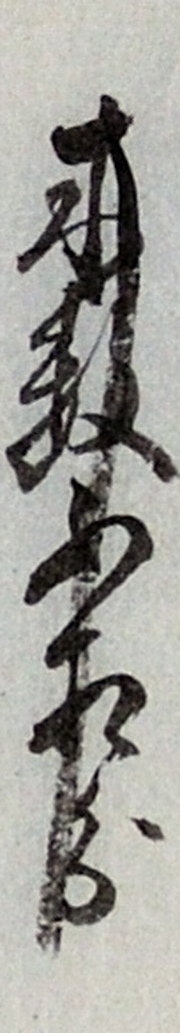木数不相分
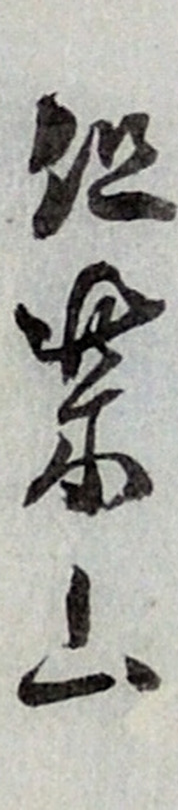但柴山
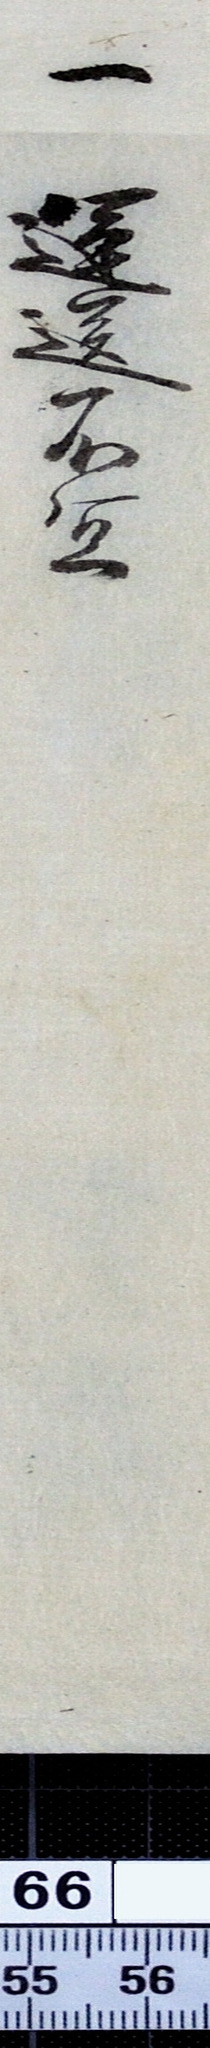一運送不宜
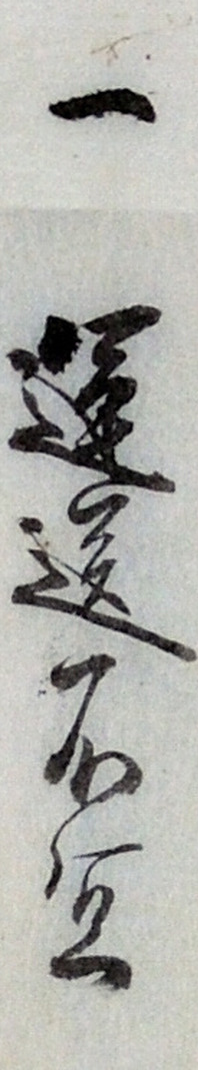一運送不宜
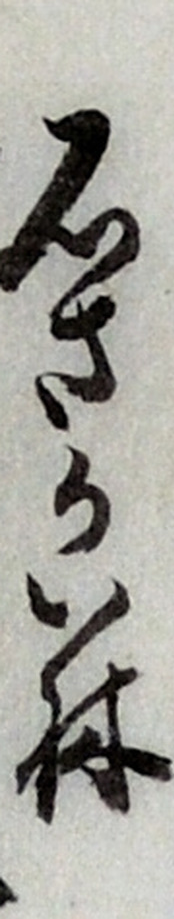石さろい林
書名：官林反別帳
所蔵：伊那市立高遠町図書館・合同会社AMANE
